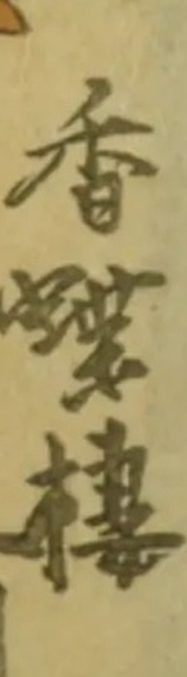香蝶棲
